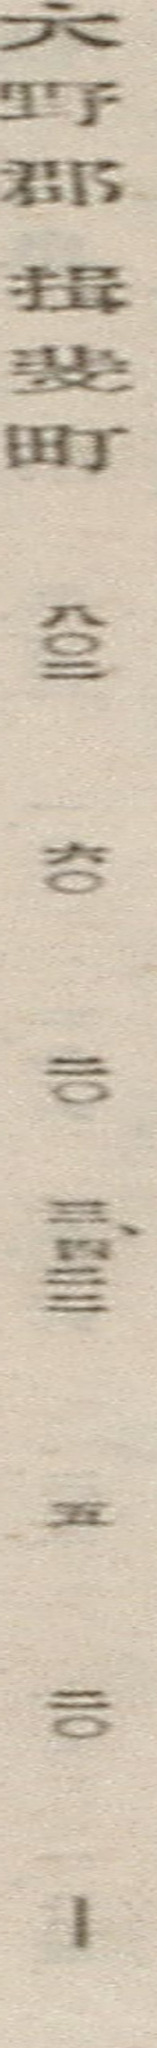大野郡揖斐町八〇二六〇二〇三、四二二五二〇―
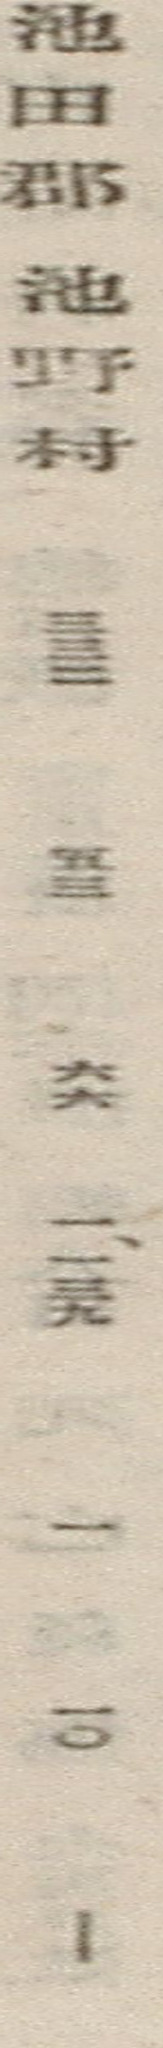池田郡池野村三三二五三六六一、一三九一一〇―
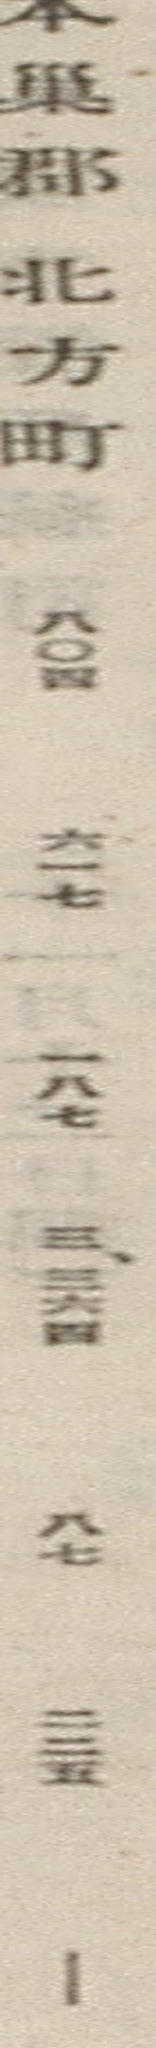本巣郡北方町八〇四六一七一八七三、三六四八七二二五―
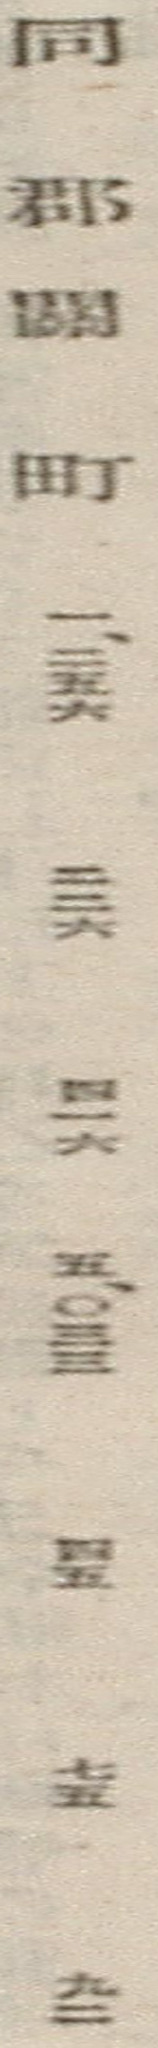同郡関町一、二五六二二六四一六五、〇三三四五七五九二
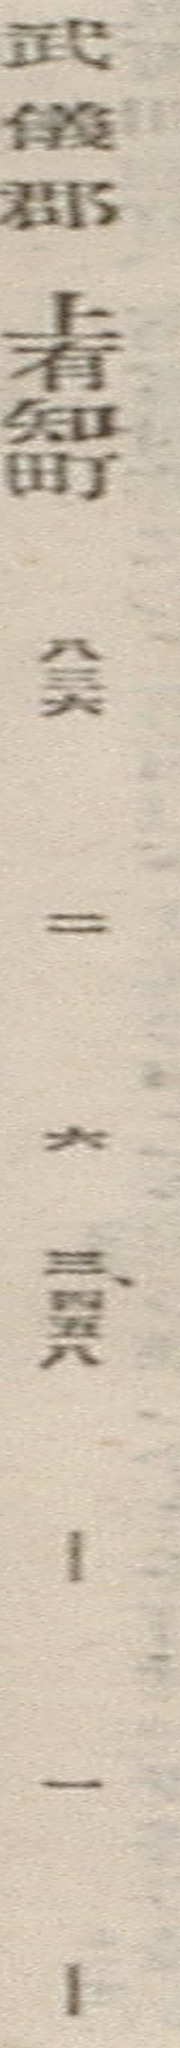武儀郡上有知町八三六二六三、四五八―一―
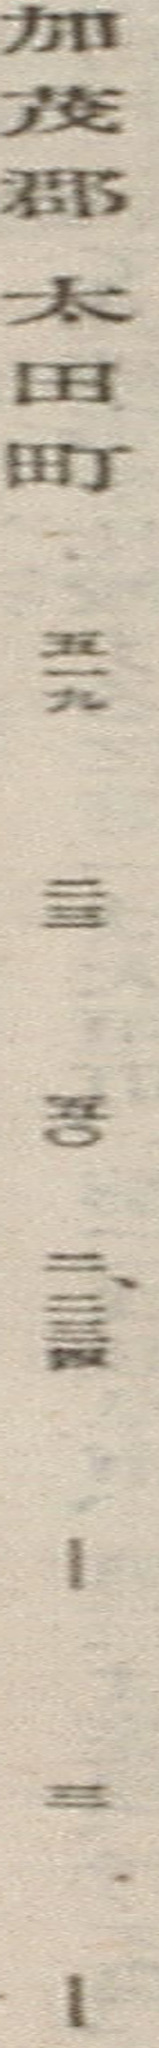加茂郡太田町五一九二三五〇二、二三四―三―
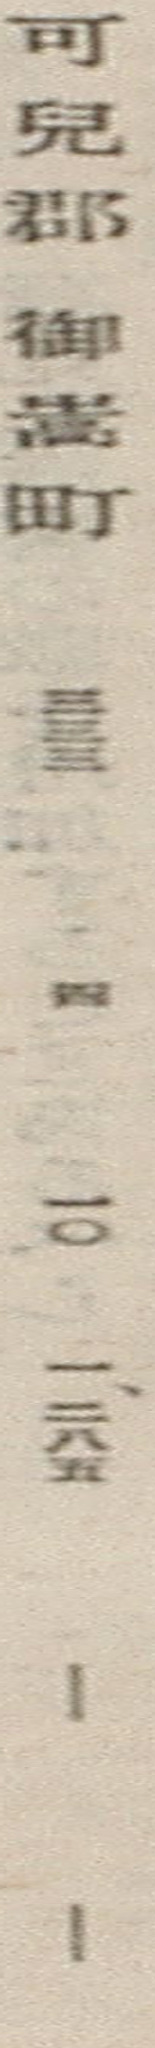可児郡御嵩町三三三四一〇一、二八五―――
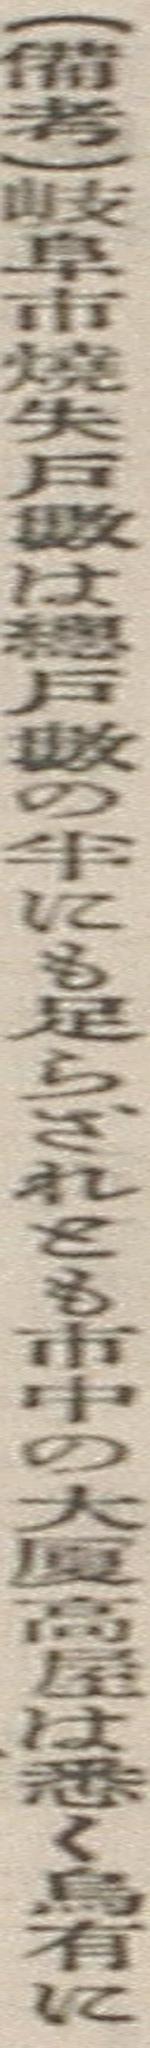岐阜市焼失戸数は総戸数の半にも足らざれとも市中の大厦高屋は悉く鳥有に
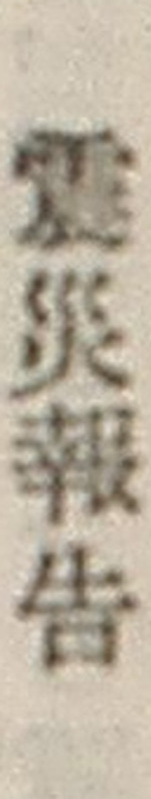震災報告
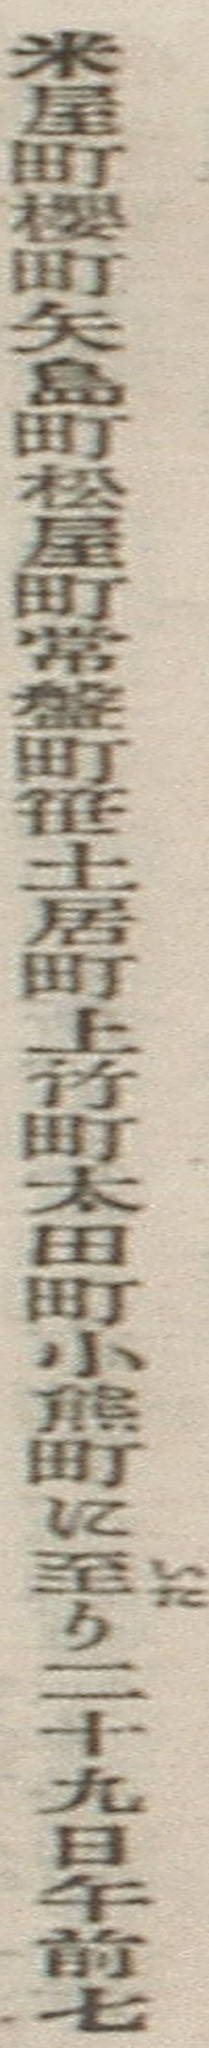米屋町桜町矢島町松屋町常盤町笹土居町上竹町太田町小熊町に至いたり二十九日午前七

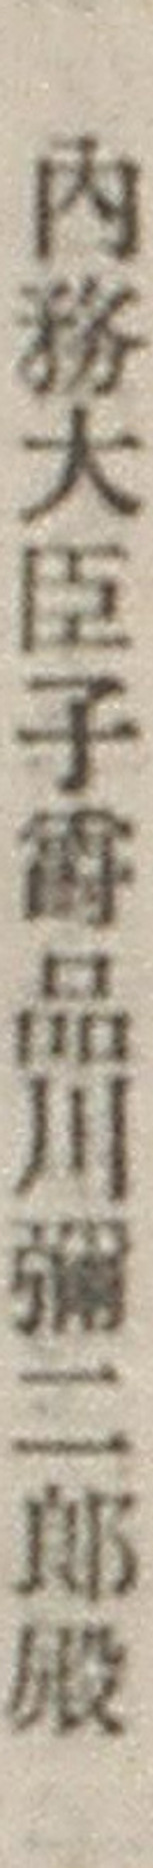内務大臣子爵品川弥二郎殿

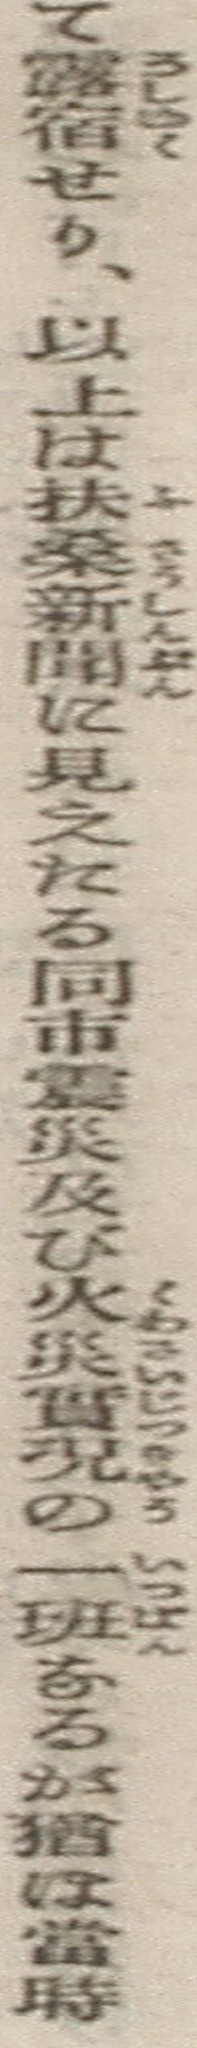て露宿せり、以上は扶桑新聞に見えたる同市震災及び火災実況の一班なるが猶ほ当時
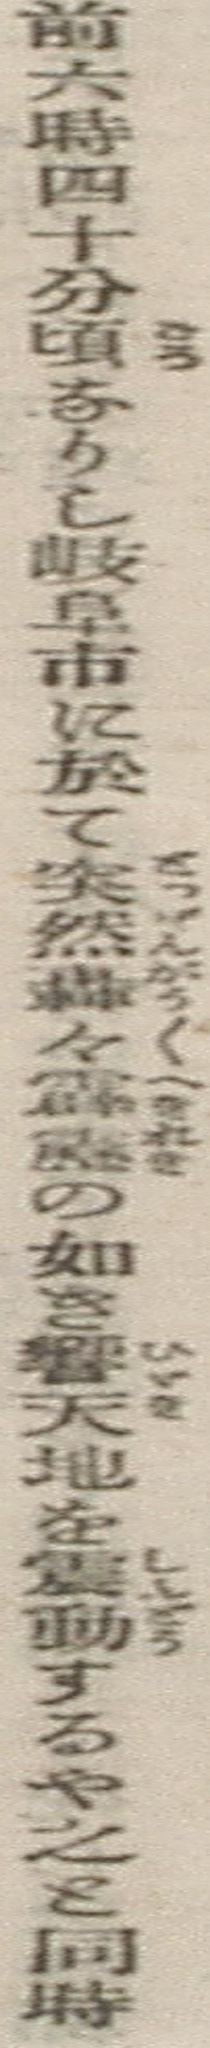前六時四十分頃なりし岐阜市に於て突然轟々霹靂の如き響天地を震動するや之と同時
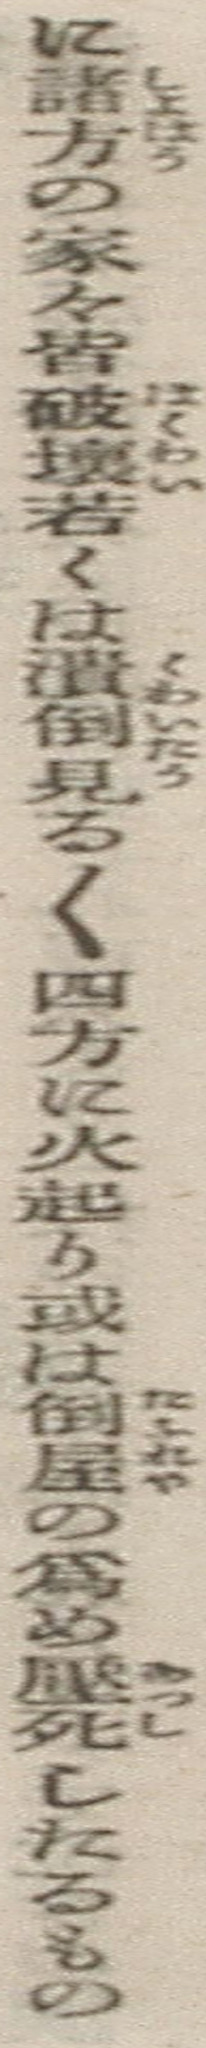に諸方の家々皆破壊若くは潰倒見る〳〵四方に火起り或は倒屋の為め圧死したるもの
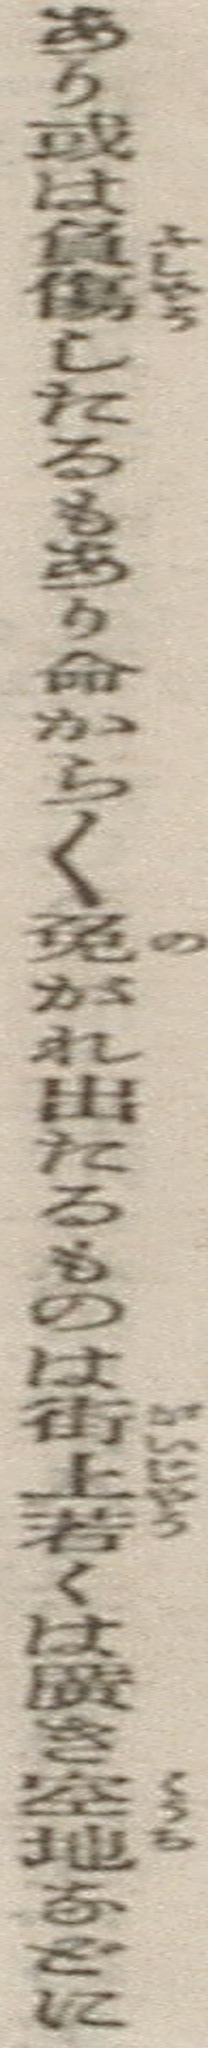あり或は負傷したるもあり命から〳〵免がれ出たるものは街上若くは広き空地などに
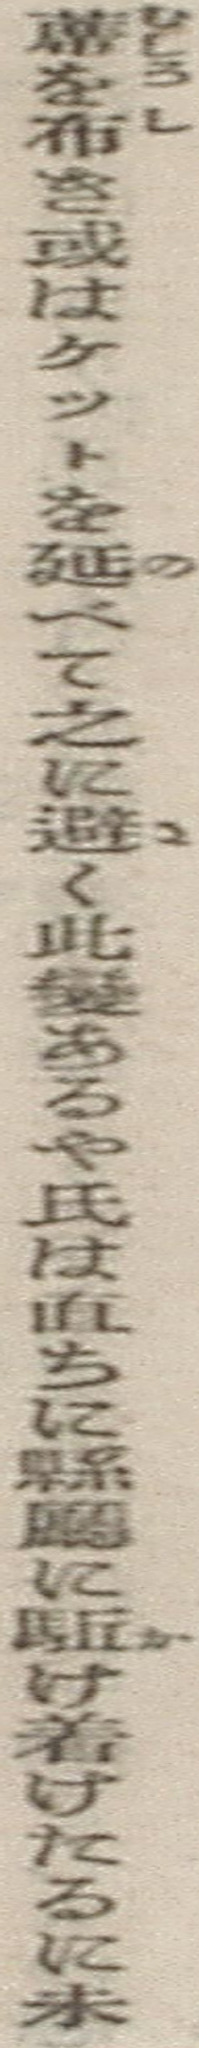蓆を布き或はケットを延べて之に避く此変あるや氏は直ちに県庁に駆け着けたるに未
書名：愛知岐阜福井三県　大地震見聞録（内題）
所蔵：東京大学地震研究所図書室 Earthquake Research Institute Library, The University of Tokyo, JAPAN
